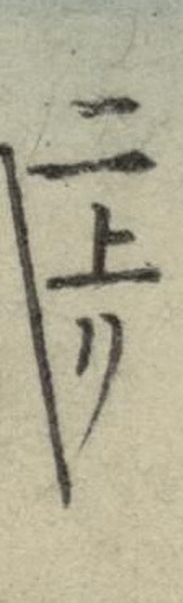二上り
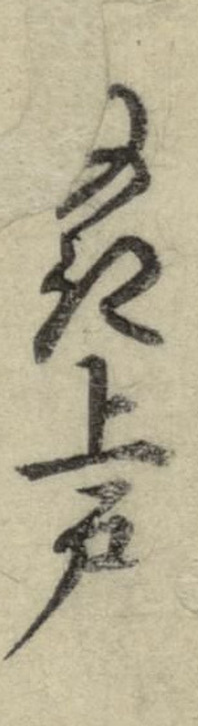なき上戸
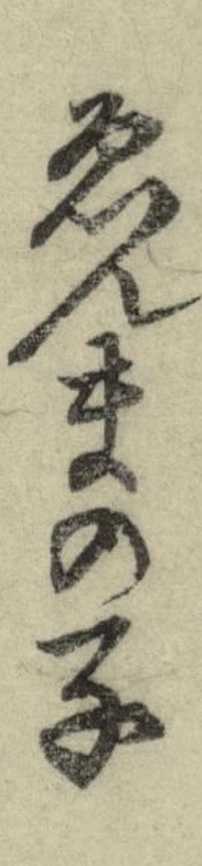ゑんまの子
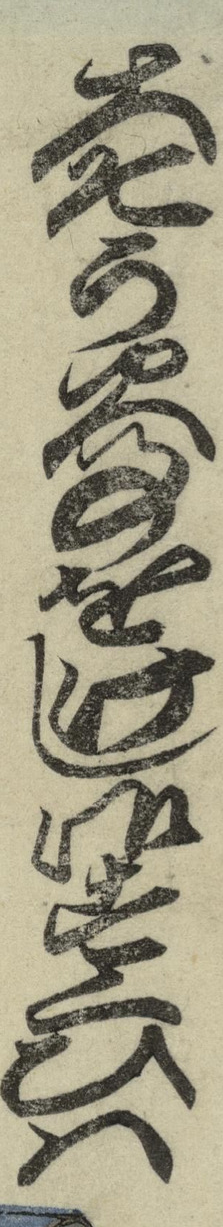大そう火事をけし御すくひは
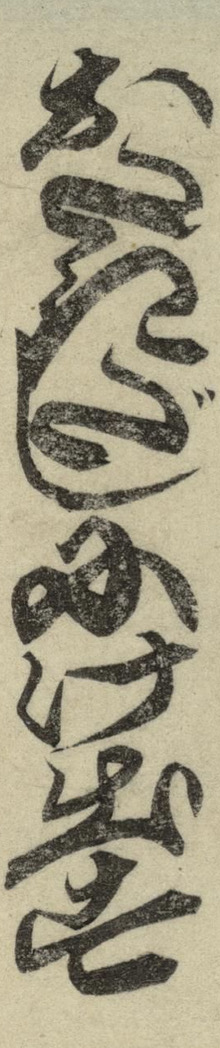おたきだしにけ出す
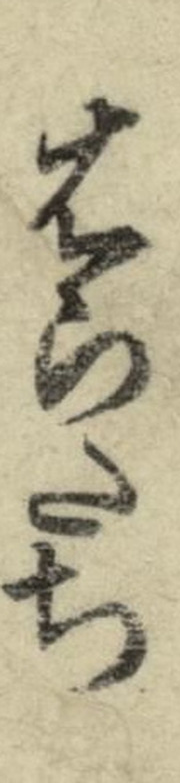はらたち
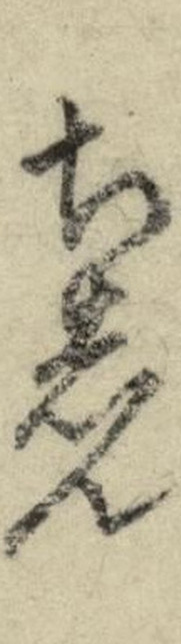ちしん
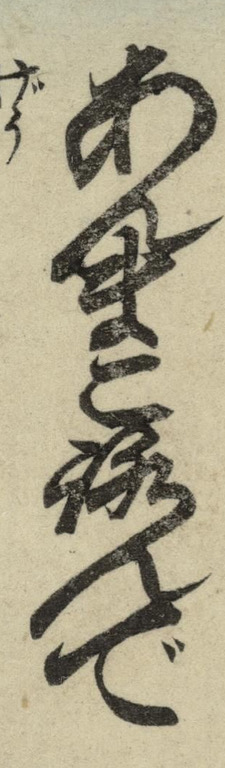あんまころんで
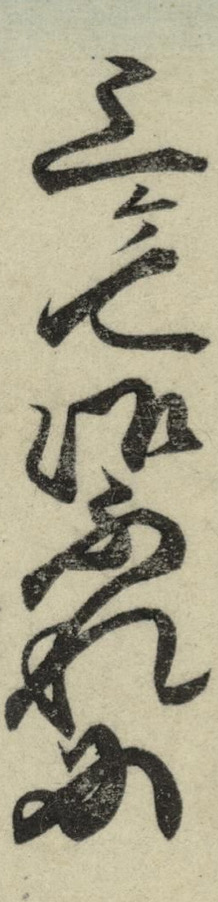上けて御ふれに
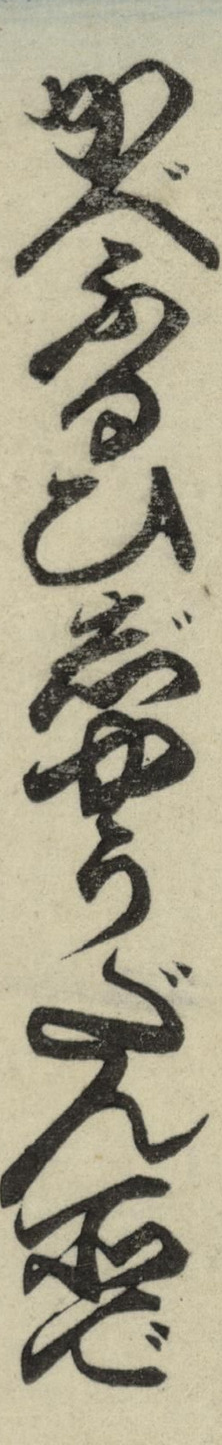かべふるひじやうだん所で
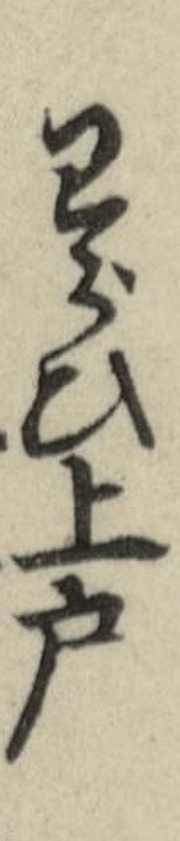わらひ上戸
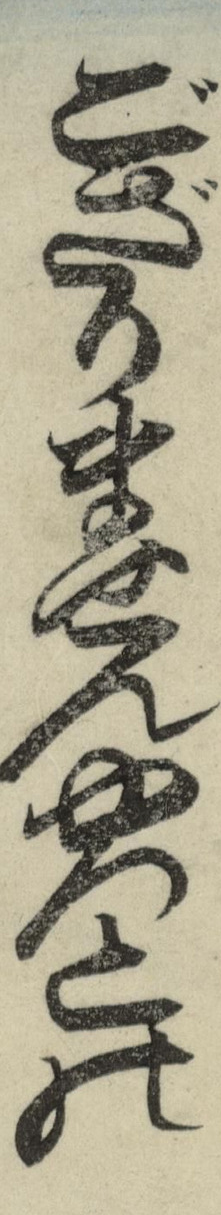ござりませんやつとの
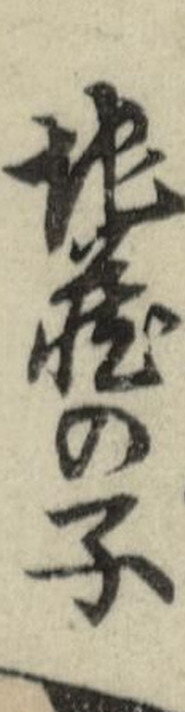地蔵の子
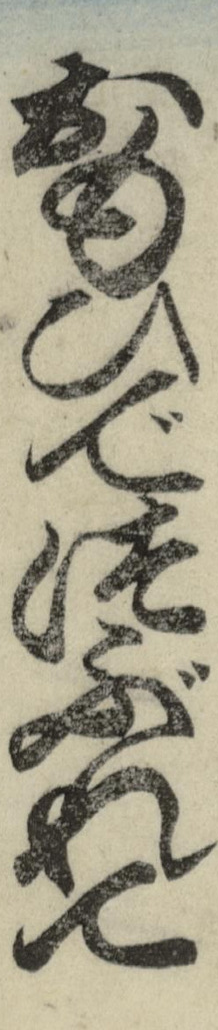おもひでつぶれて
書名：大津會ぶし
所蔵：東京大学地震研究所図書室 Earthquake Research Institute Library, The University of Tokyo, JAPAN
